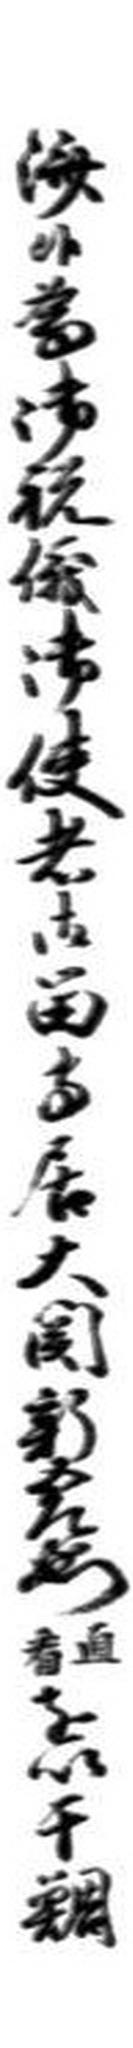済候為御祝儀御使者御留守居大関新五左衛門直看を以干鯛
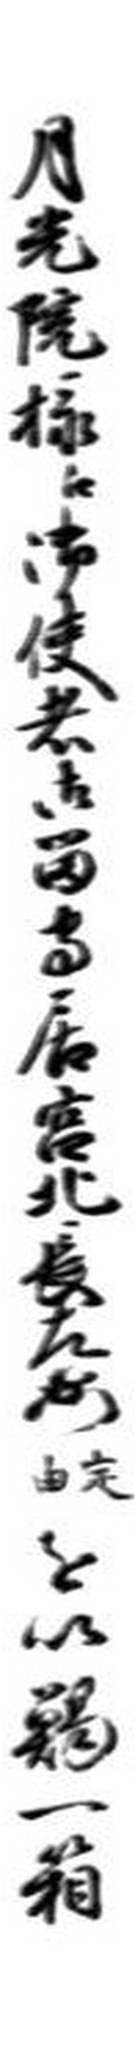月光院様江御使者御留守居宮北長左衛門定由を以鯣一箱

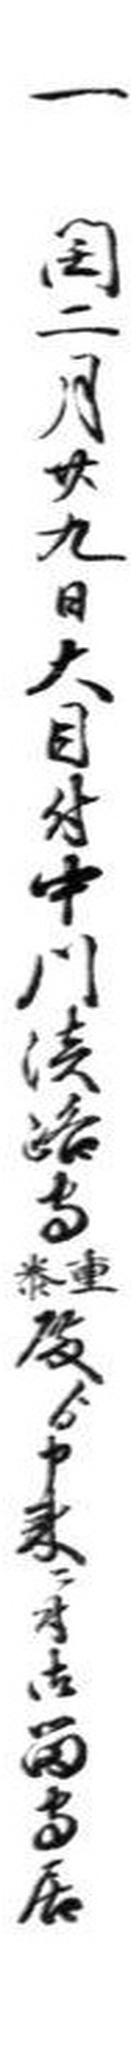一閏二月廿九日大目付中川淡路守重泰殿ゟ申来ニ付御留守居
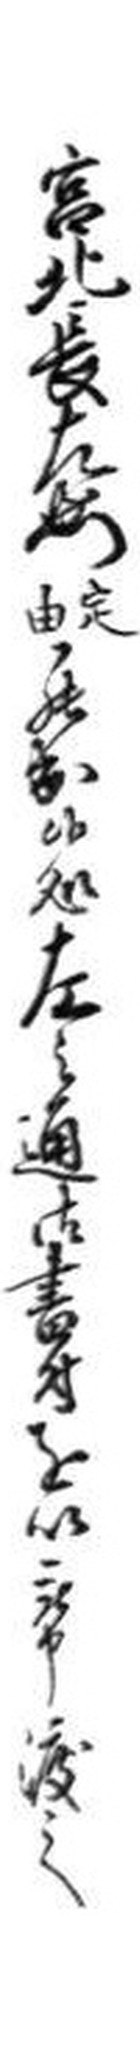宮北長左衛門定由罷出候処左之通御書付を以被申渡之
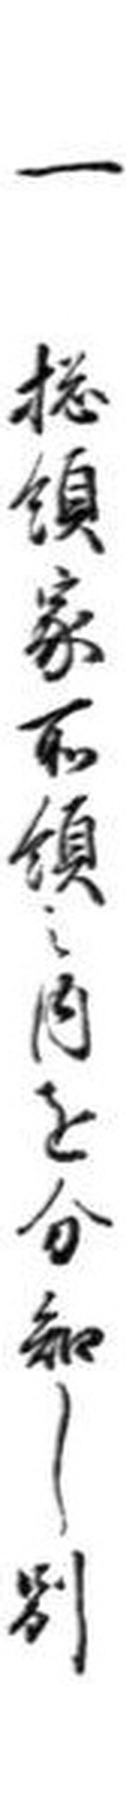一総領家所領之内を分知し別
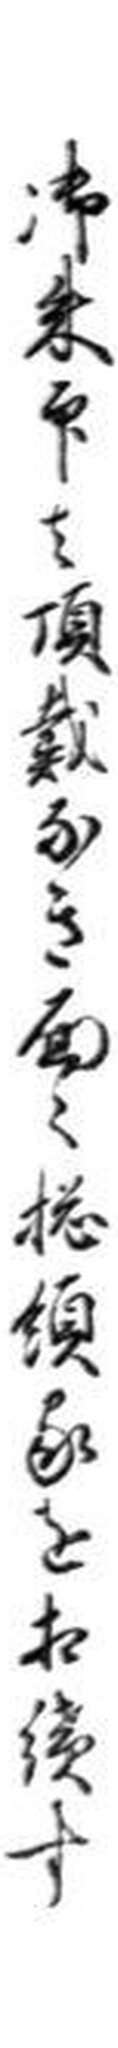御朱印を頂戴なき面々総領家を相続す
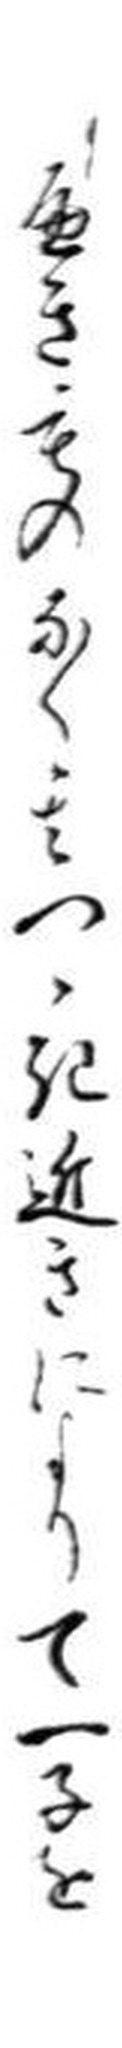へきものなく其つゝき近きによりて一子を
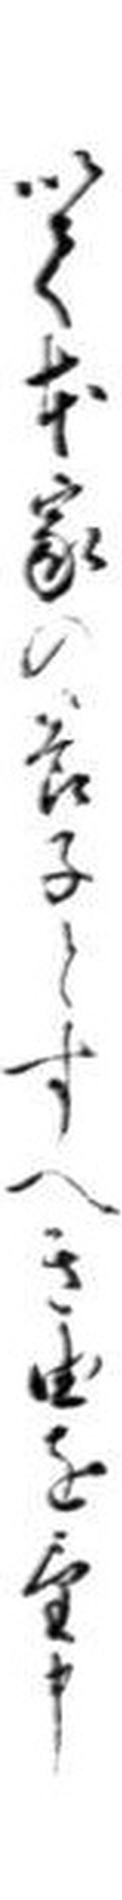以て本家の養子とすへき由を望申
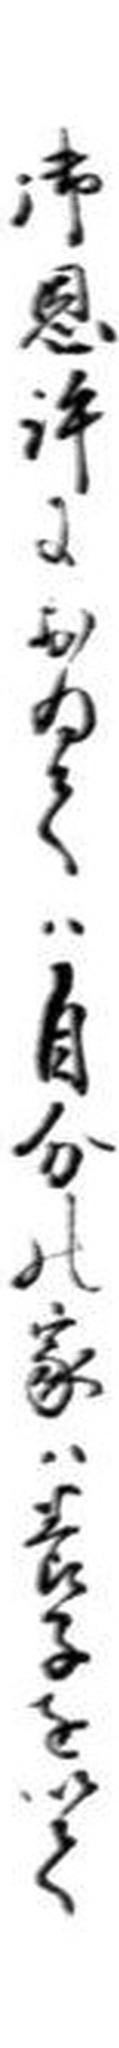御恩許におゐてハ自分の家ハ養子を以て
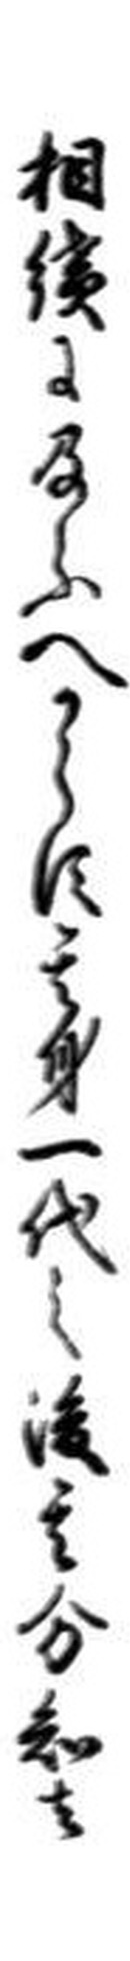相続に及ふへからす其身一代之後其分知者
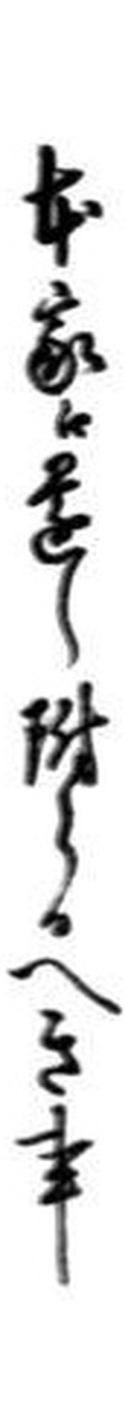本家江還し附らるへき事
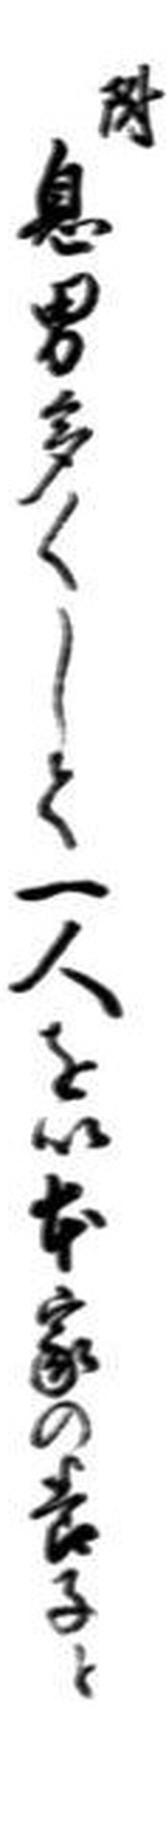息男多くして一人を以本家の養子と
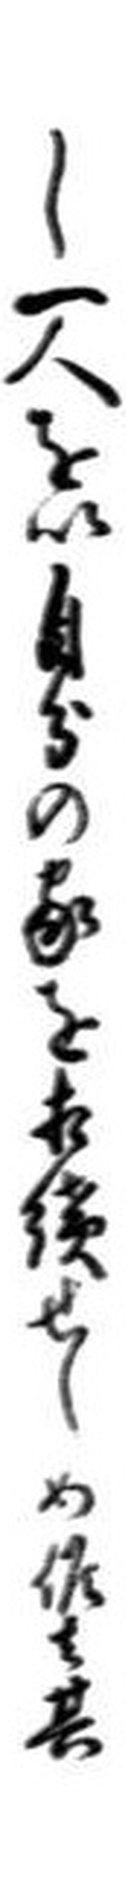し一人を以自分の家を相続せしめ候者其
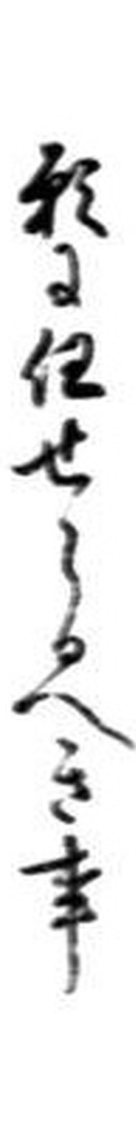願に任せらるへき事
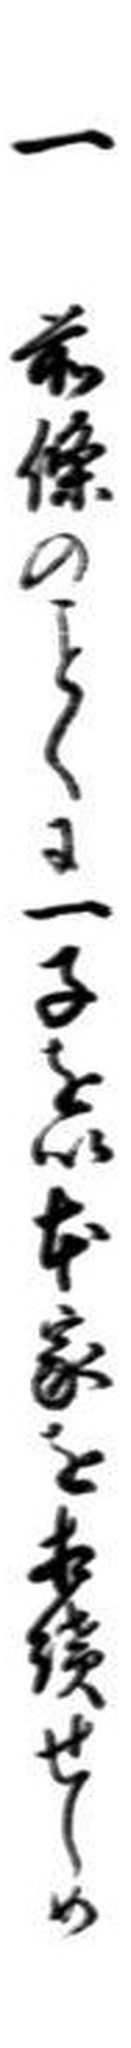一前条のことくに一子を以本家を相続せしめ
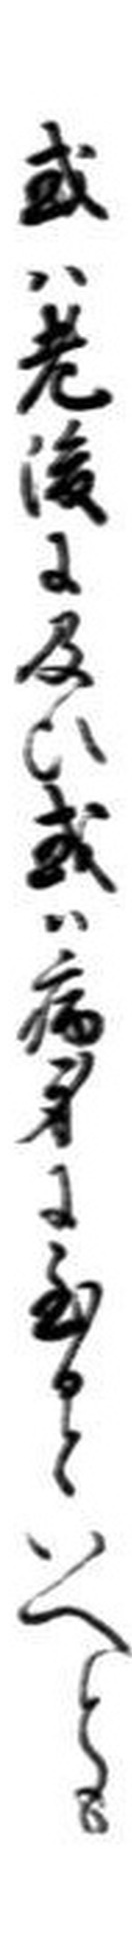或ハ老後に及ひ或ハ病身に至るといへとも
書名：家譜 三十一 吉邦公 享保元年
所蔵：福井県文書館 Fukui Prefectural Archives
